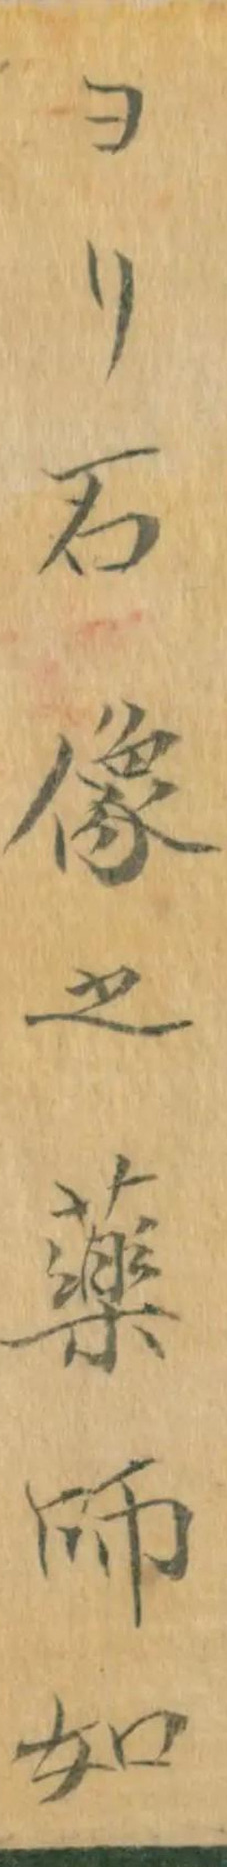ヨリ石像之薬師如
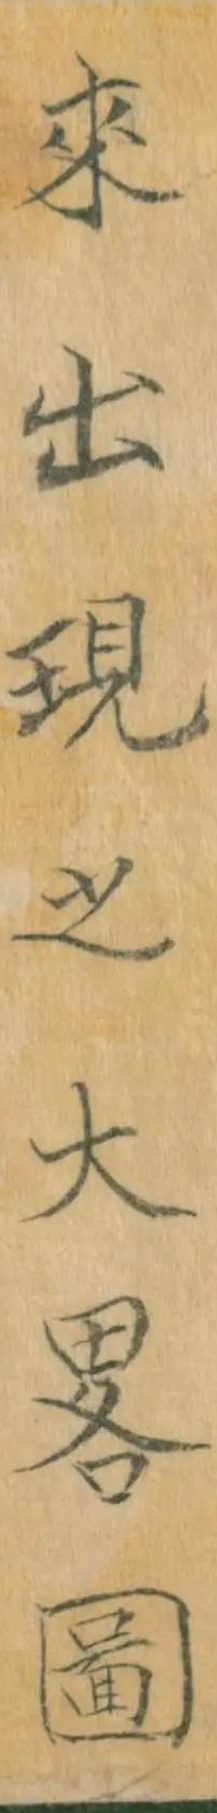来出現之大畧圖

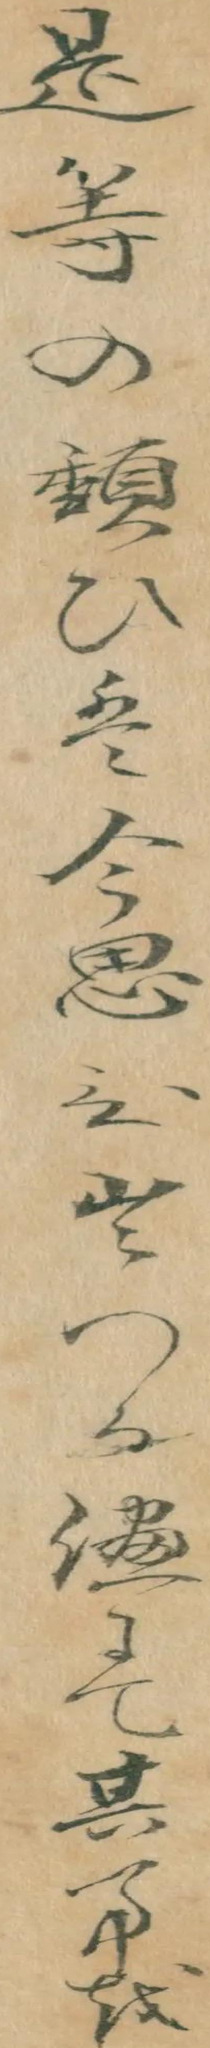是等の頽ひは今思ひ出つる儘にて其事を
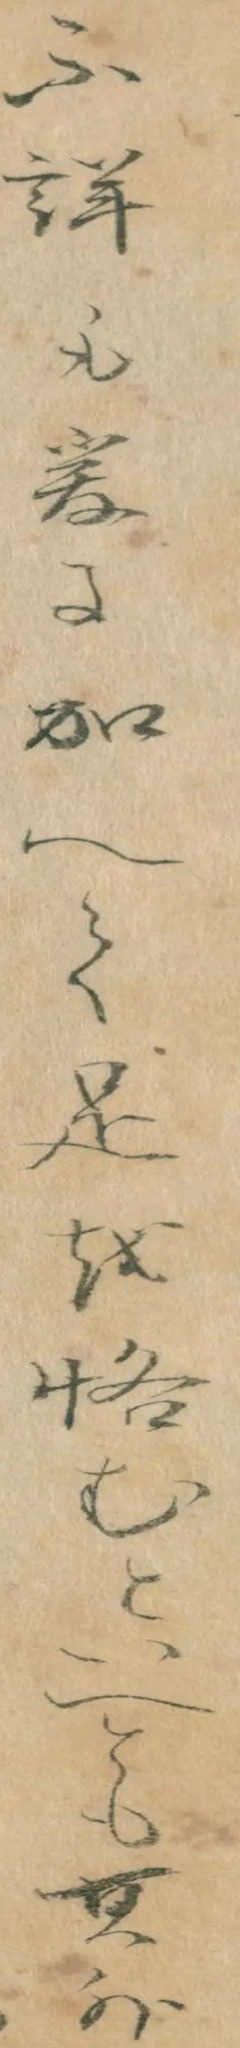不詳も爰に加へて足を恪むといへとも其外
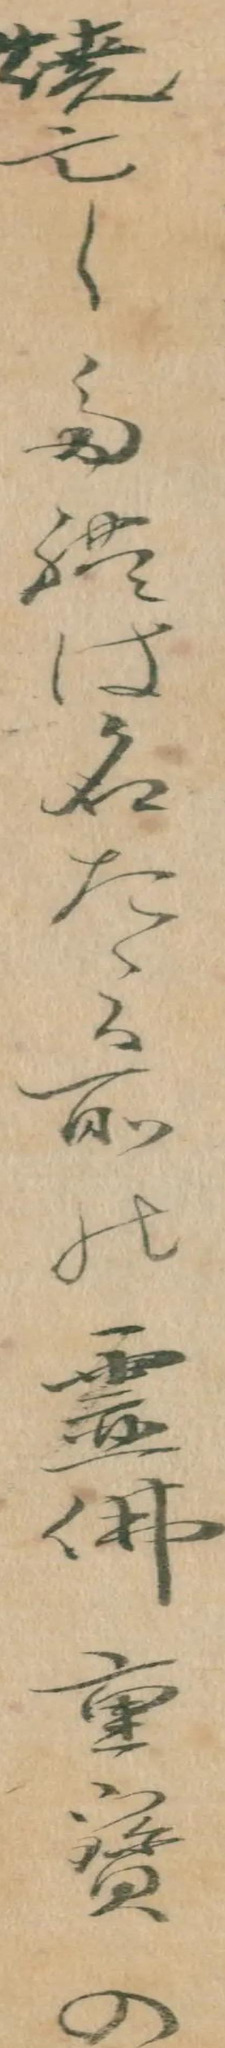焼亡したれは名たゝる所の霊佛重寶の
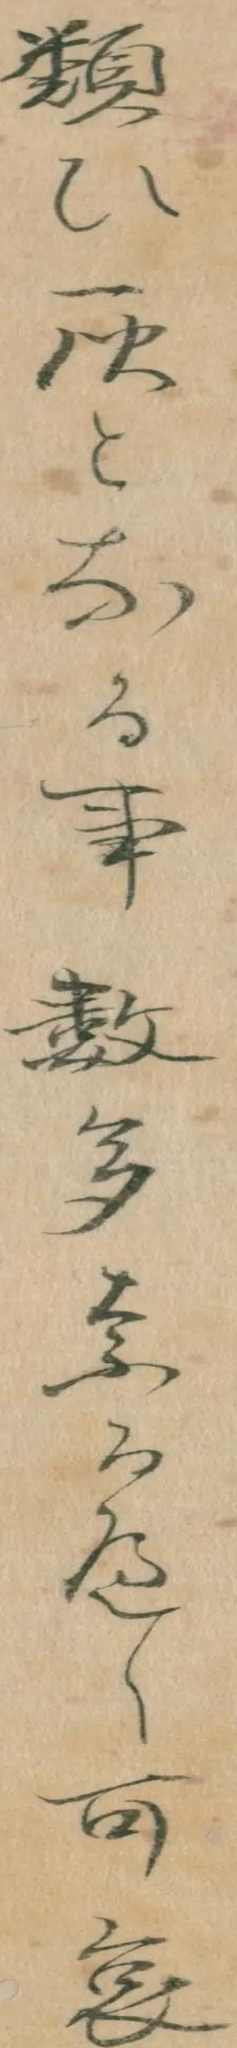類ひ灰となる事数多なるへし可哀
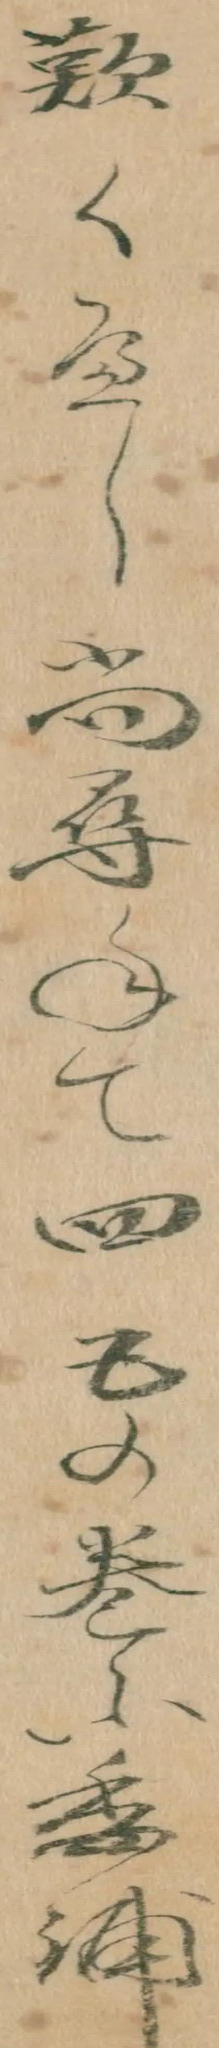歎くへし尚尋ねて四五の巻に委鋪
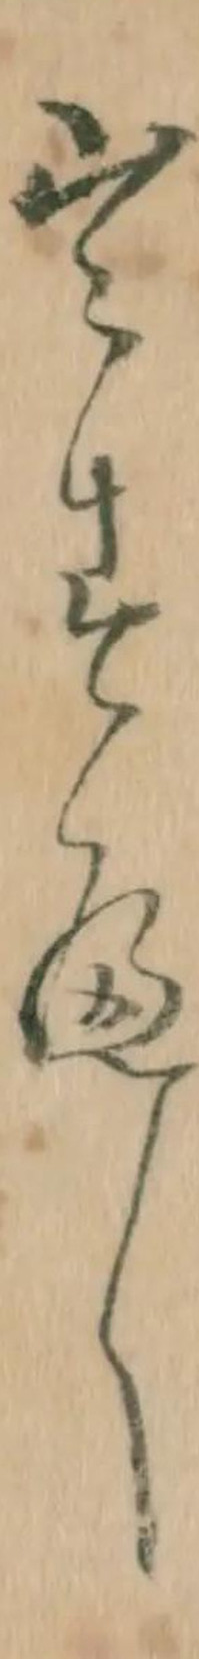出すへし
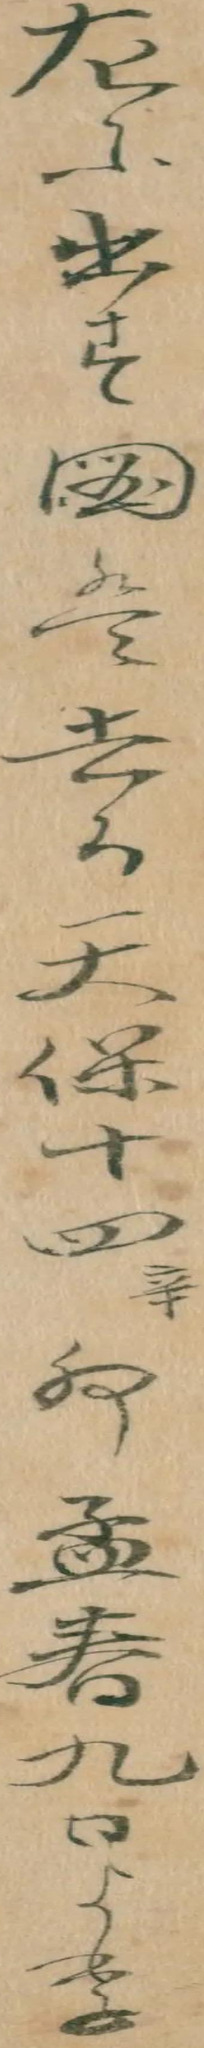左に出す図は去る天保十四辛卯孟春九日より
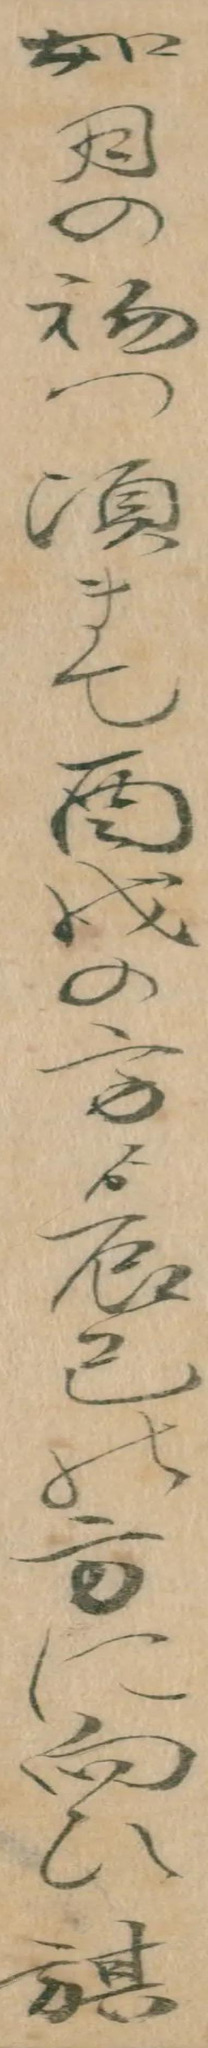如月の初つ頃まて酉戌の方ゟ辰巳の方に向ひ旗
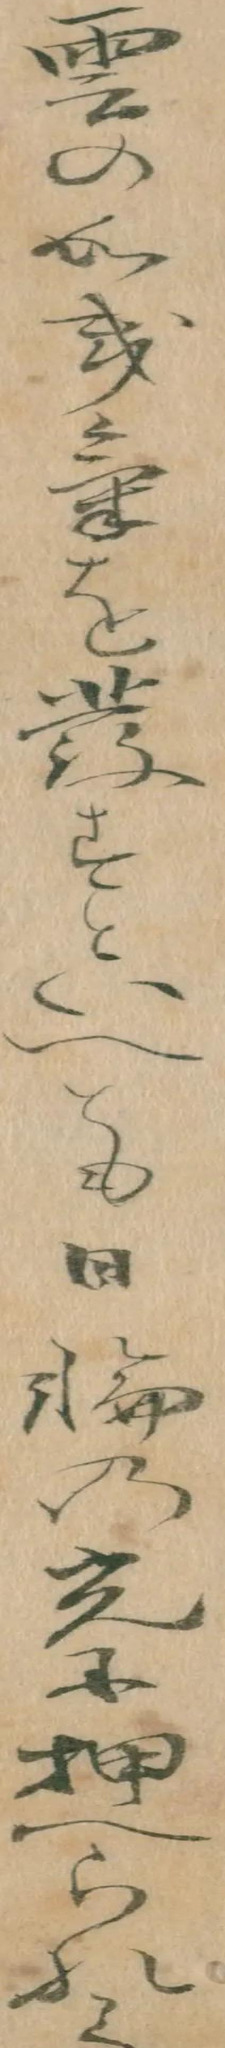雲の如き氣を発すといへとも日輪の光に押へられて
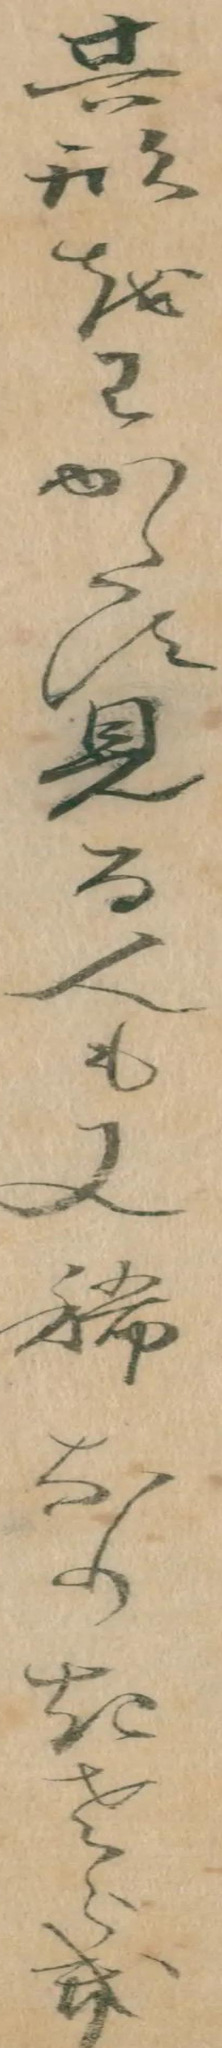其形をわかたす見る人も又稀なりきさらき
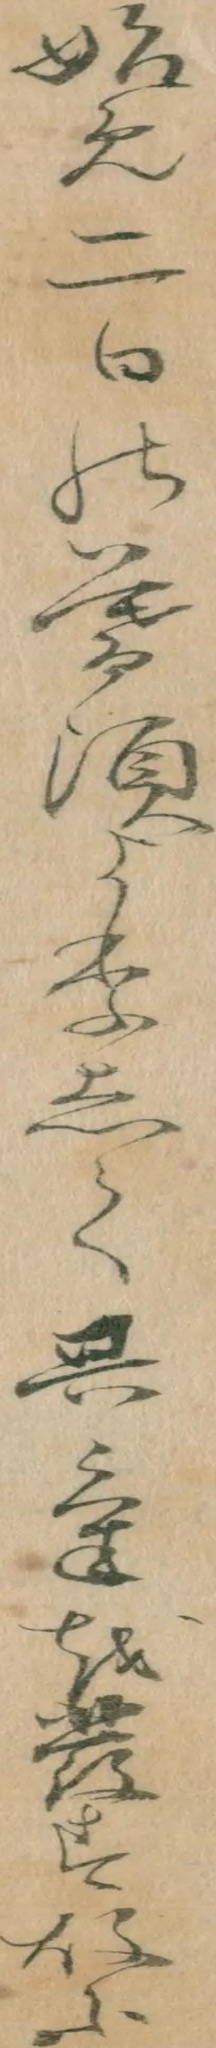始め二日の暮頃よりして其氣を發す故に
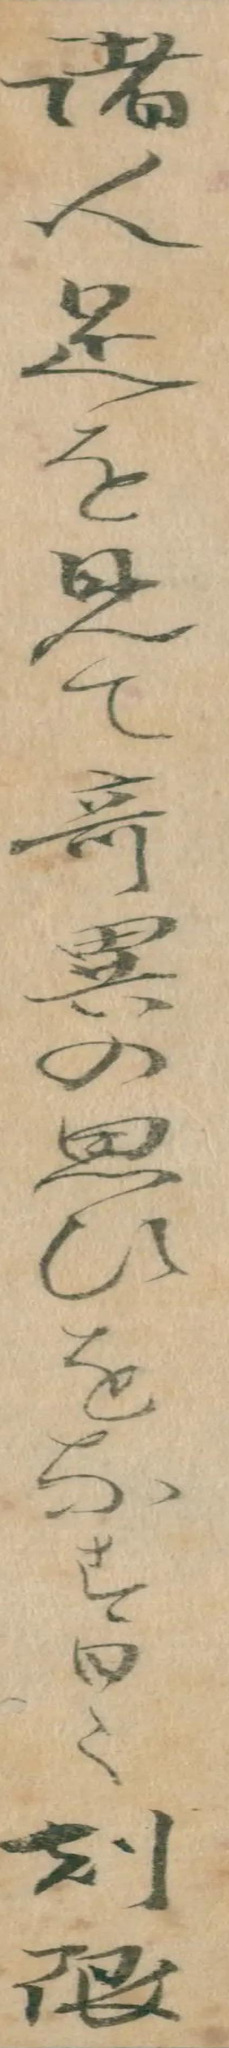諸人是を見て奇異の思ひをなす日々刻限
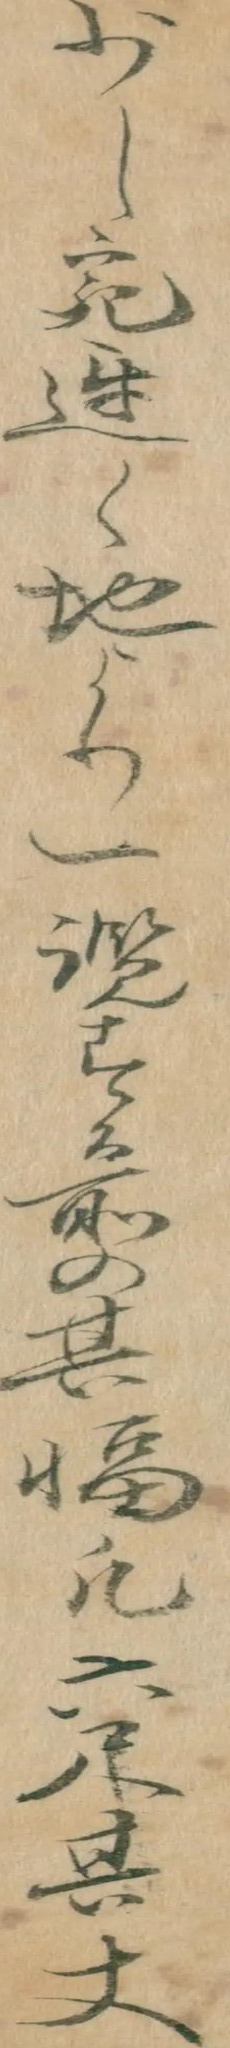少し宛遅く地より一覧する所の其幅凡六尺其丈
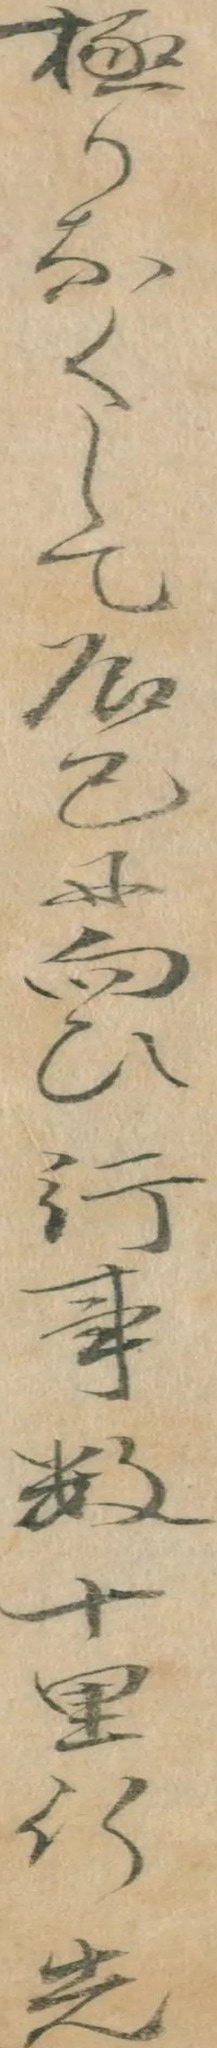極りなくして辰巳に向ひ行事数十里行先
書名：俗語之種. [7]
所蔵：国立国会図書館 National Diet Library, JAPAN
